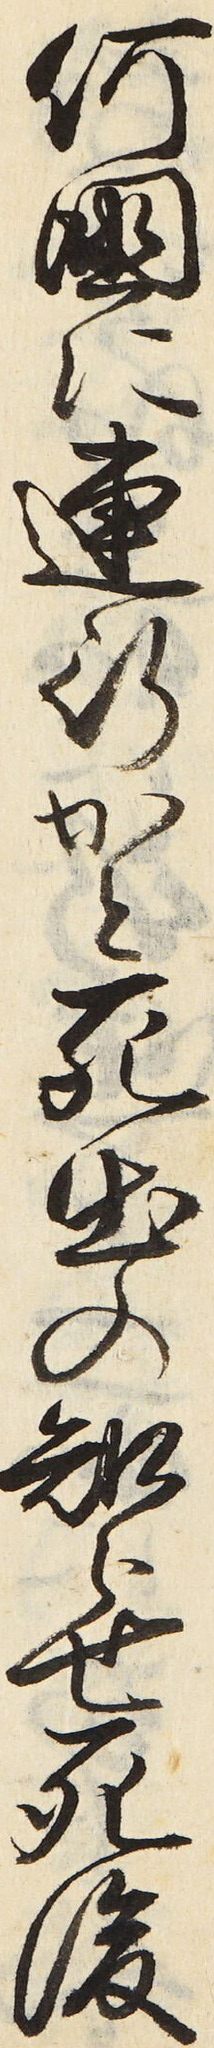何国に連行かと死出の知らせ死後
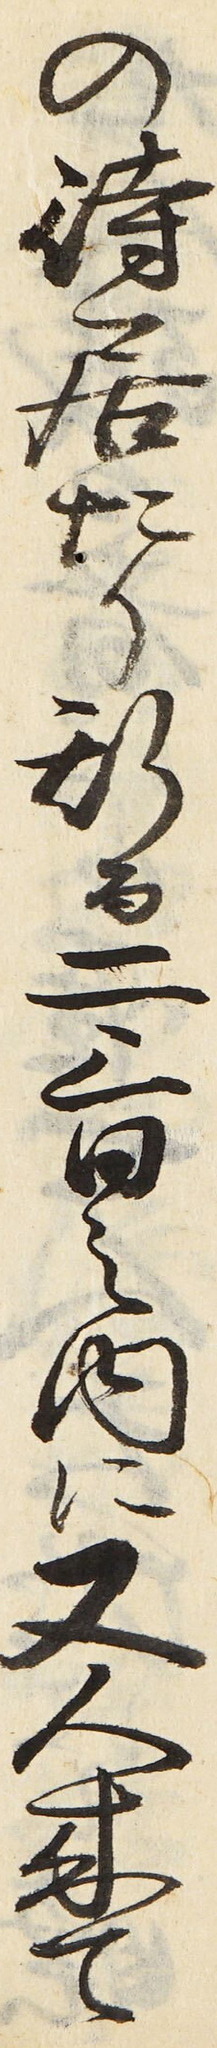の待居たり斯而二三日之内に又人来て
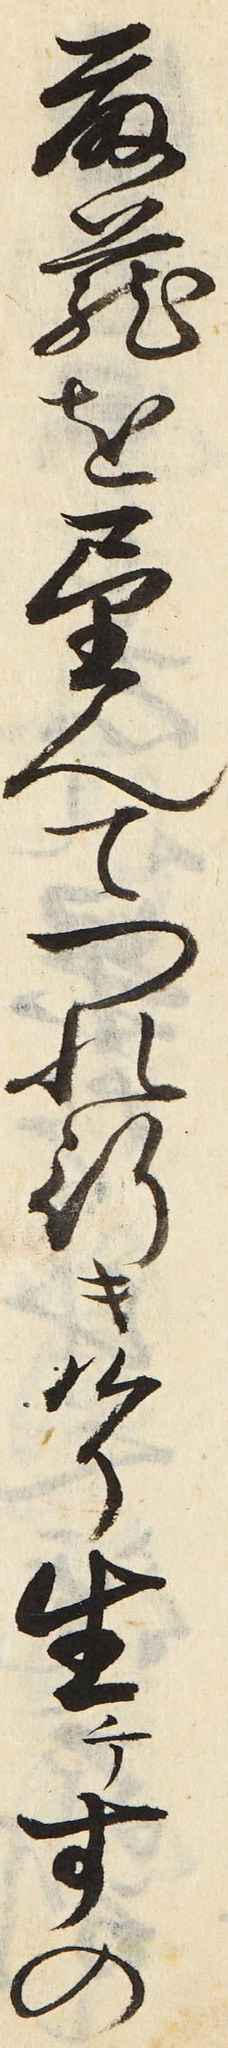藤蔵を望んでつれ行きけり生けすの
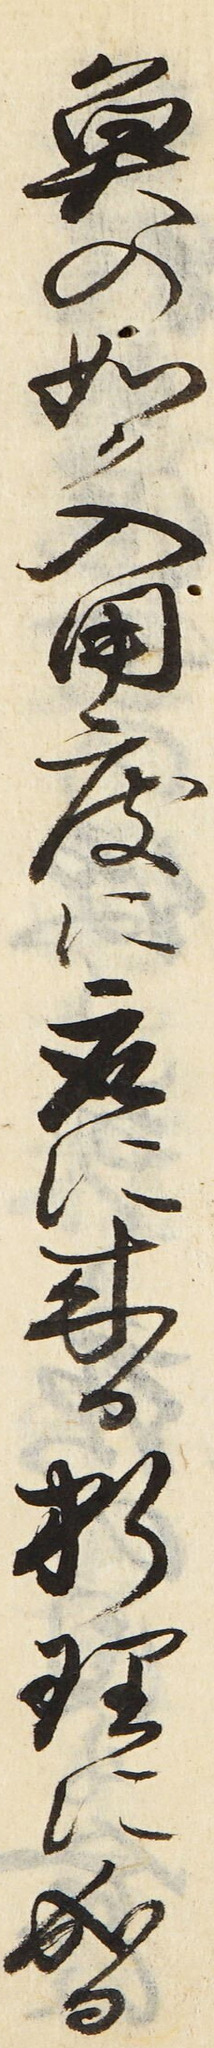魚の如く入用度に取に来る料理成る
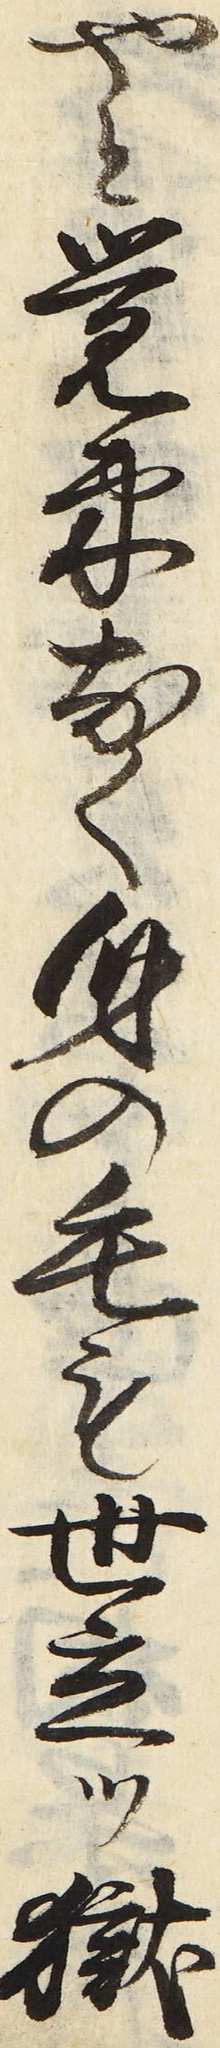やと覚束なく身の毛もよ立つ獄
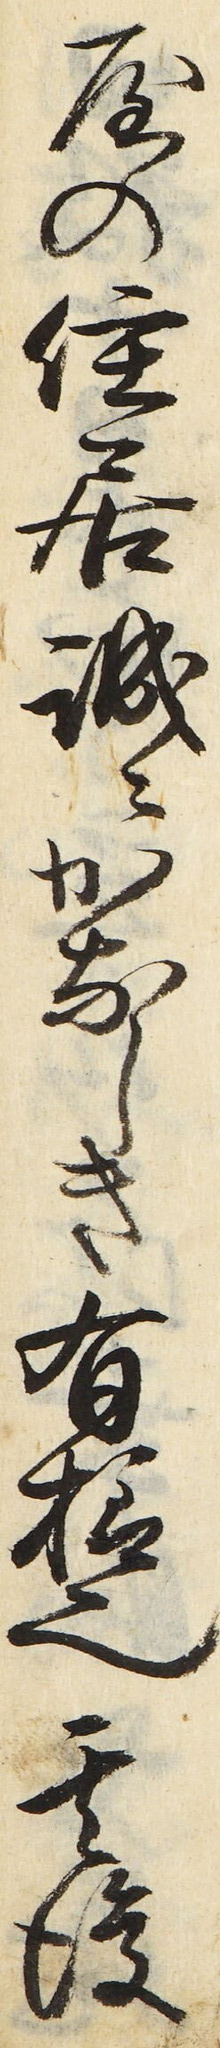屋の住居誠にかなしき有様也其後

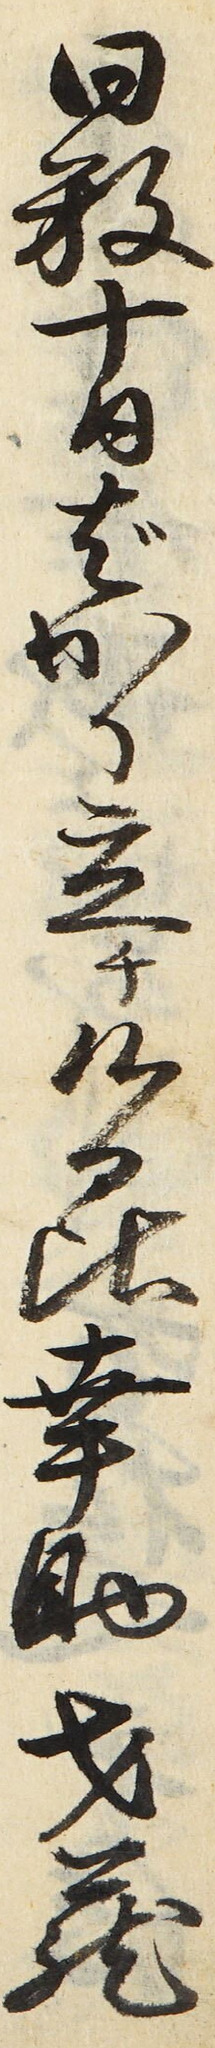日数十日ばかり立ちける頃幸助才蔵
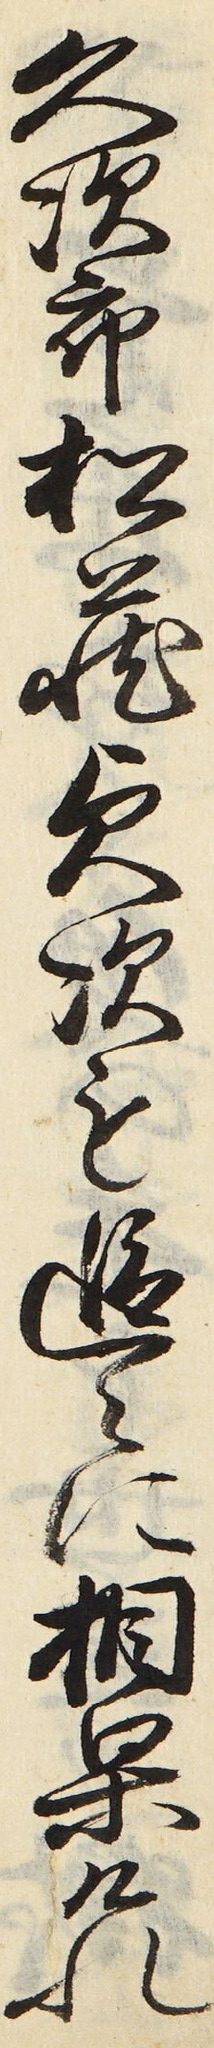久次郎松蔵貞次も追々に相果けれ
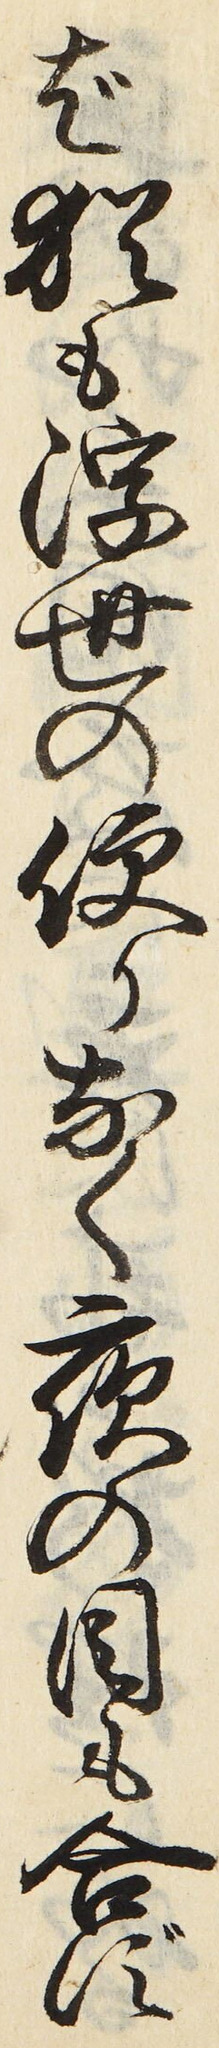ば猶も浮世の便りなく夜の目も合ず
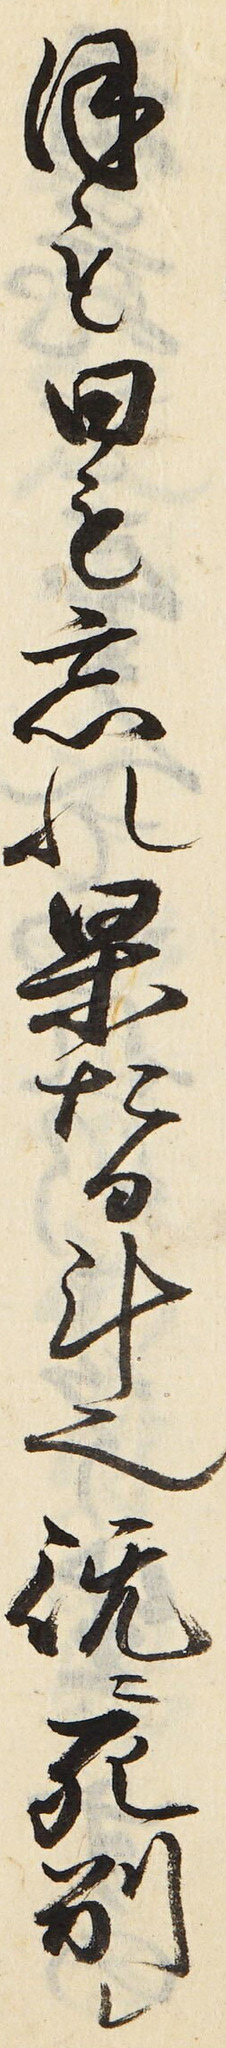月も日も忘れ果たる計也既に死別れ
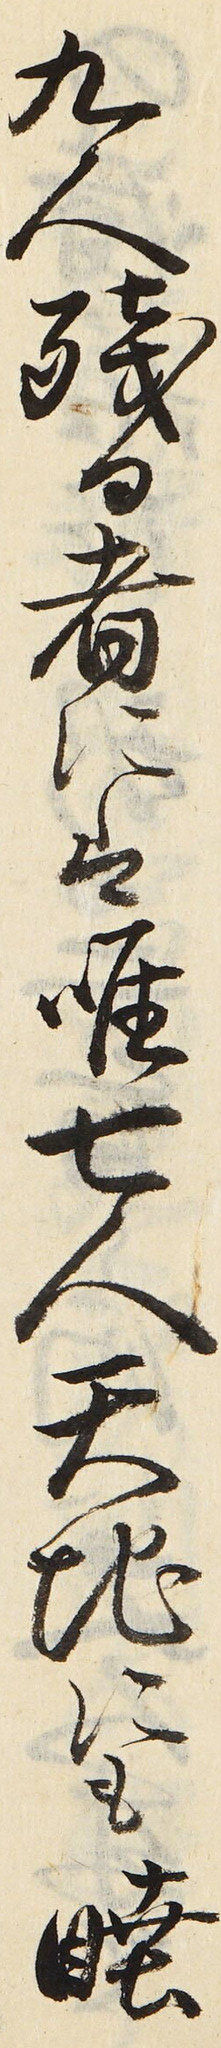九人残る者には唯七人天地にも暁
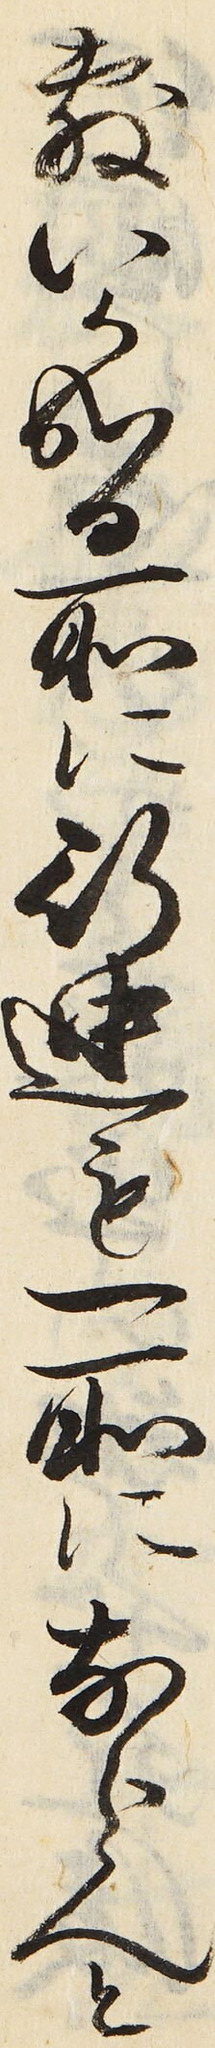敷いか成る所に行迚も一所にならんと
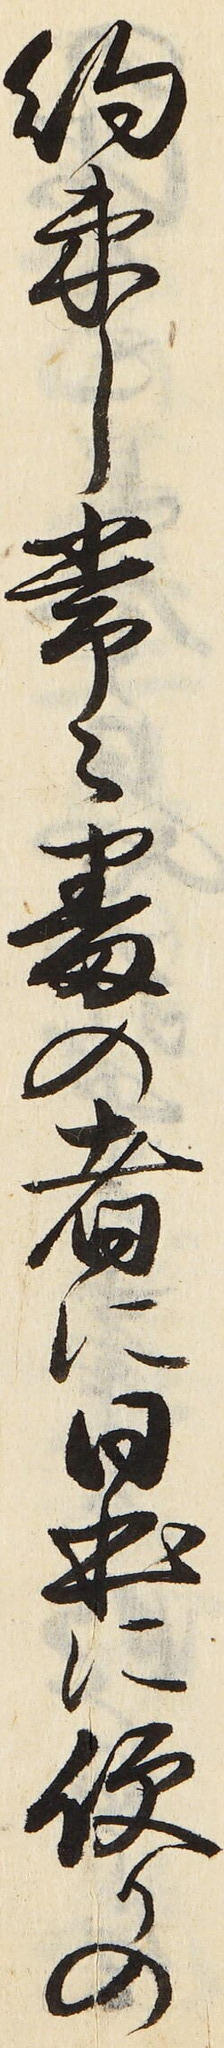約束し常々番の者に日本に便りの
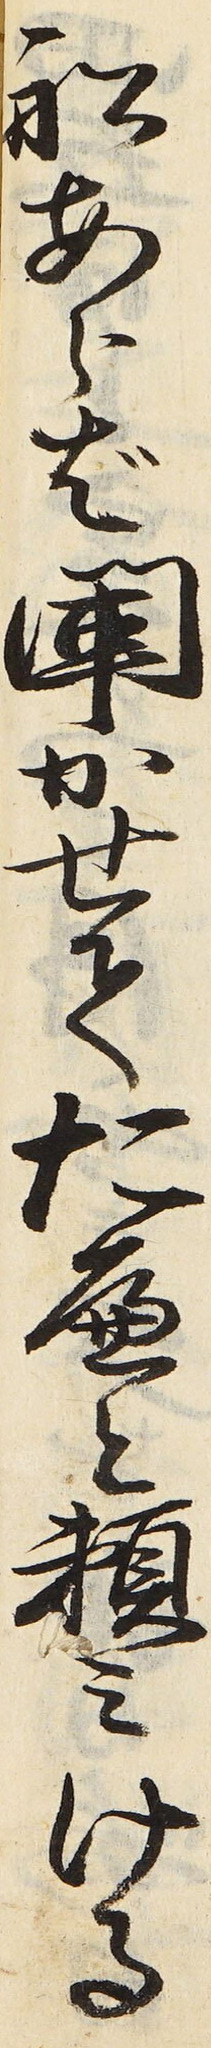船あらば聞かせてたへと頼みける
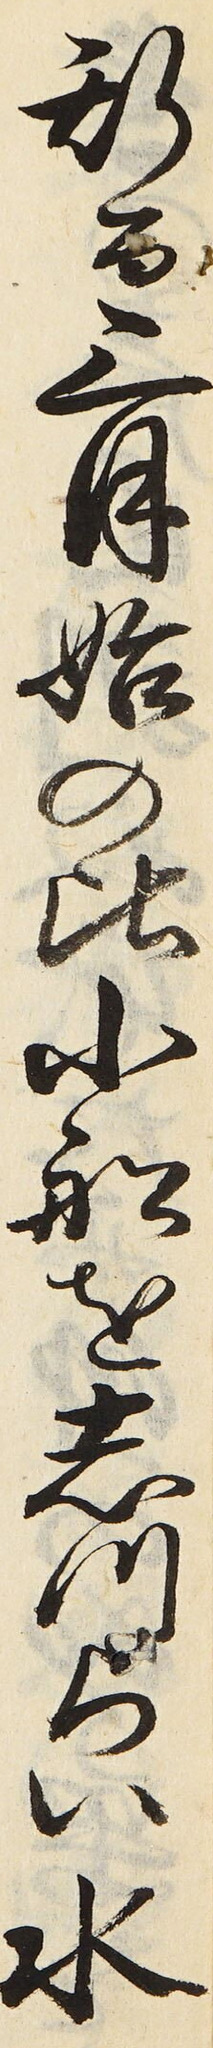斯而三月始の頃小船をしつらい水
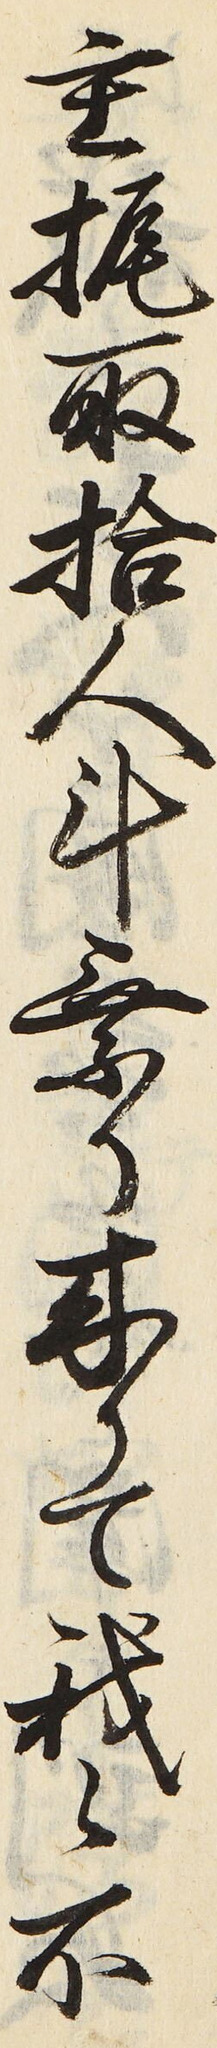主梶取拾人計乗り来りて我々不
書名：華夷九年録
